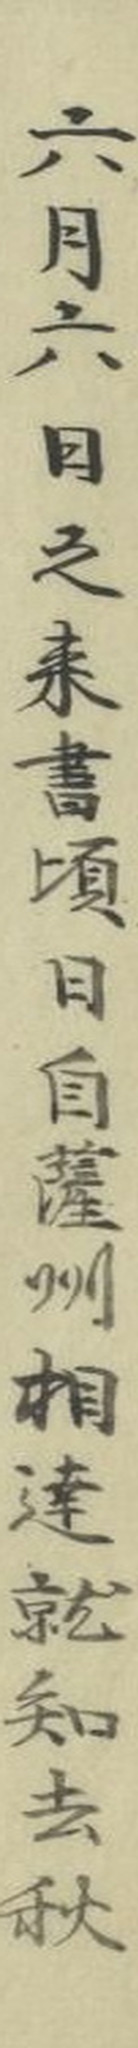六月六日之来書頃日自薩州相達就知去秋
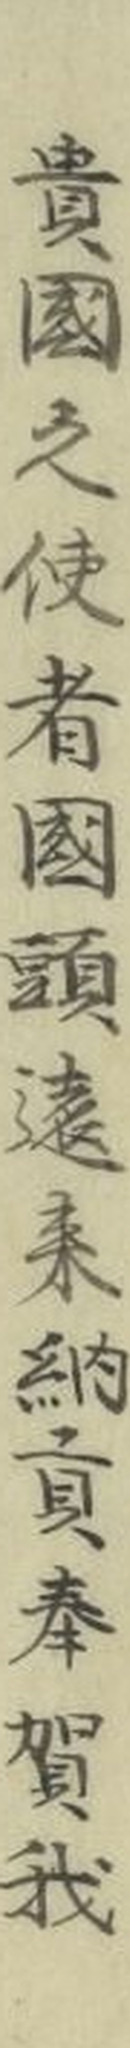貴国之使者国頭遠来納貢奉賀我
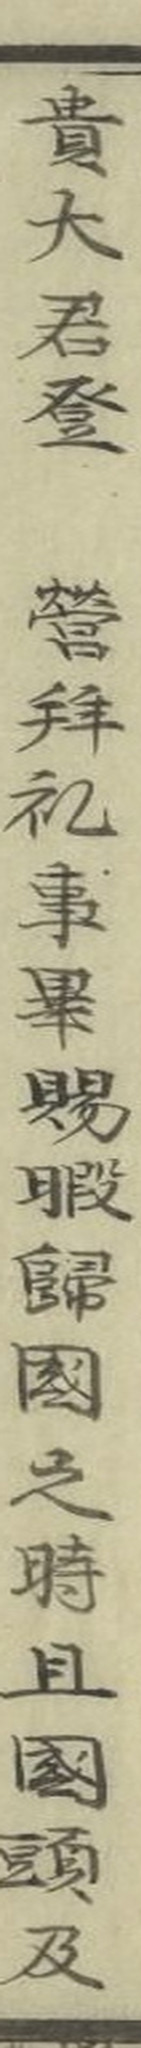貴大君登城拝礼事畢賜暇帰国之時且国頭及
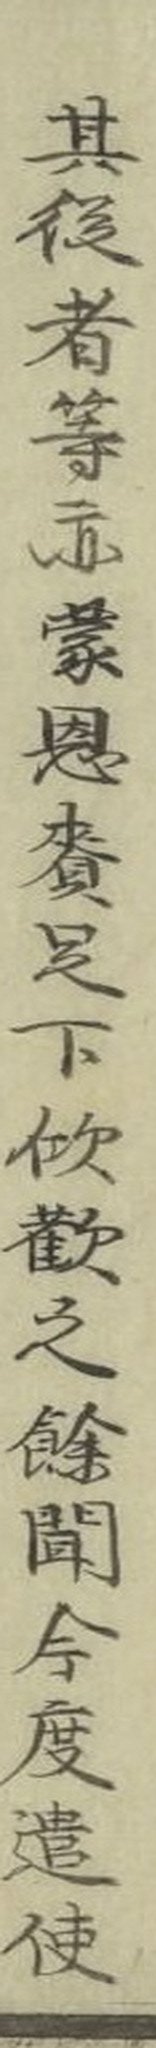其従者等亦蒙恩賓足下傾歓之余聞今度遣使
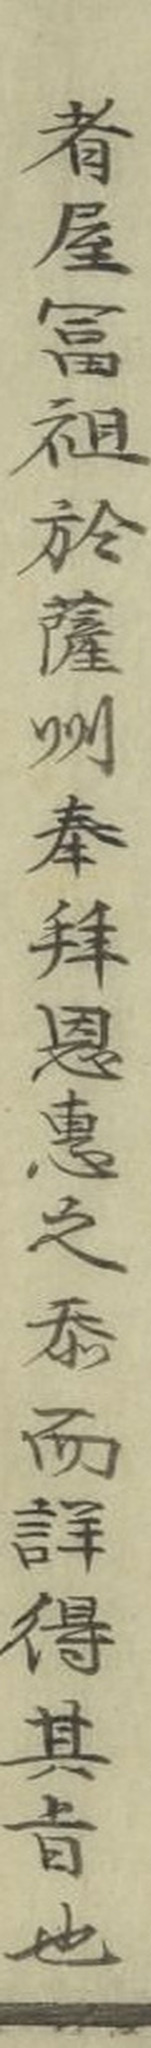者屋富祖於薩州奉拝恩恵之忝而詳得其旨也
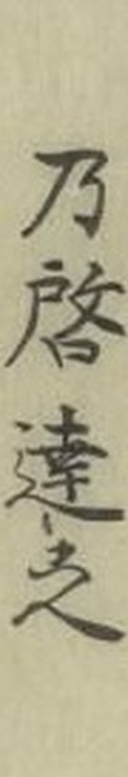乃啓達之
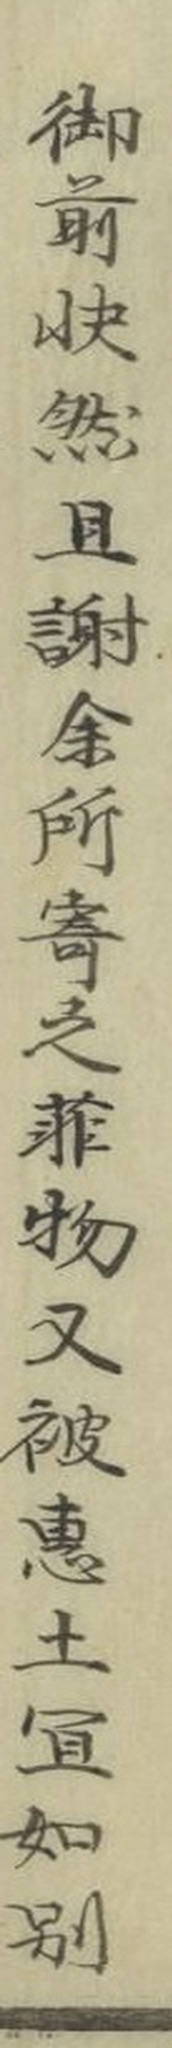御前快然且謝余所寄之菲物又被恵土冝如別
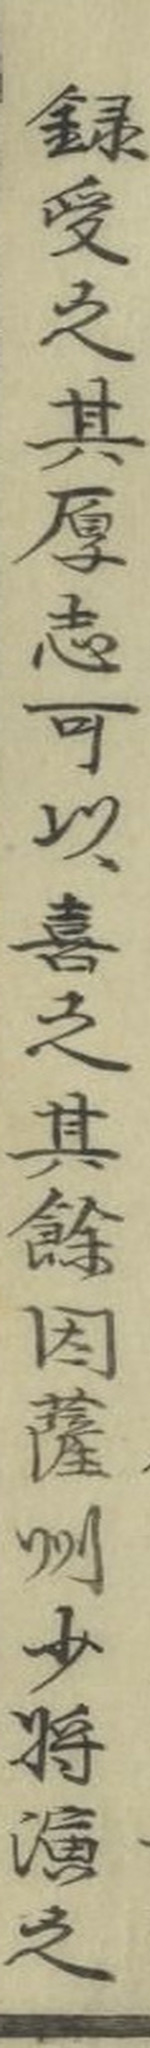録受之其厚志可以喜之其余因薩州少将演之

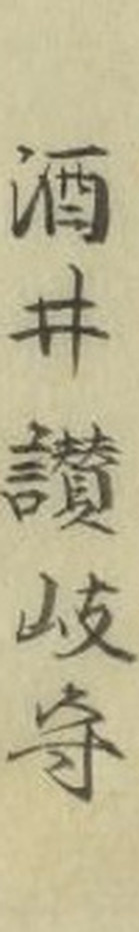酒井讃岐守
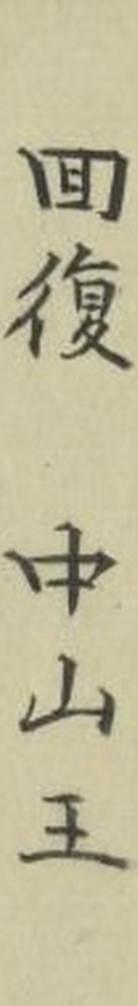回復中山王
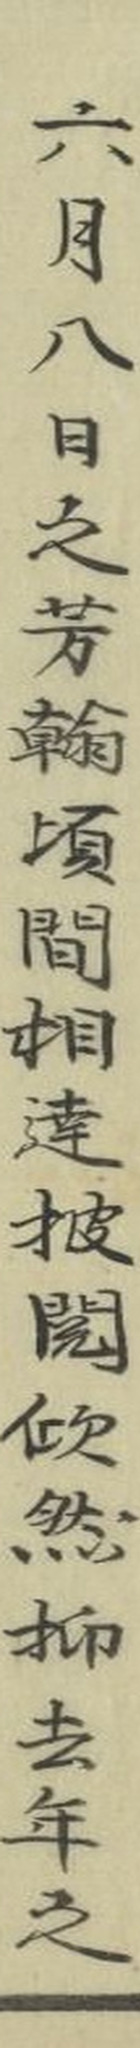六月八日之芳翰頃間送達被閲傾然抑去年之
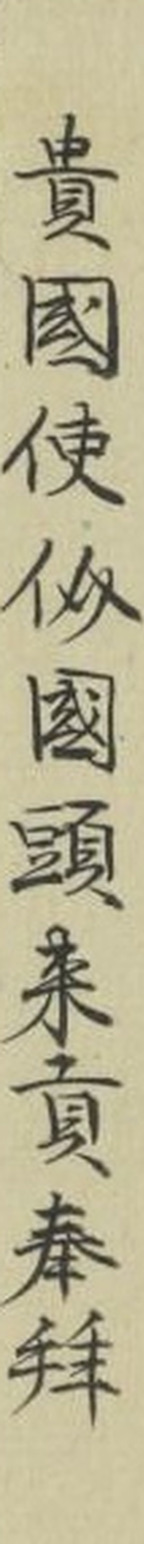貴国使价国頭来貢奉拝
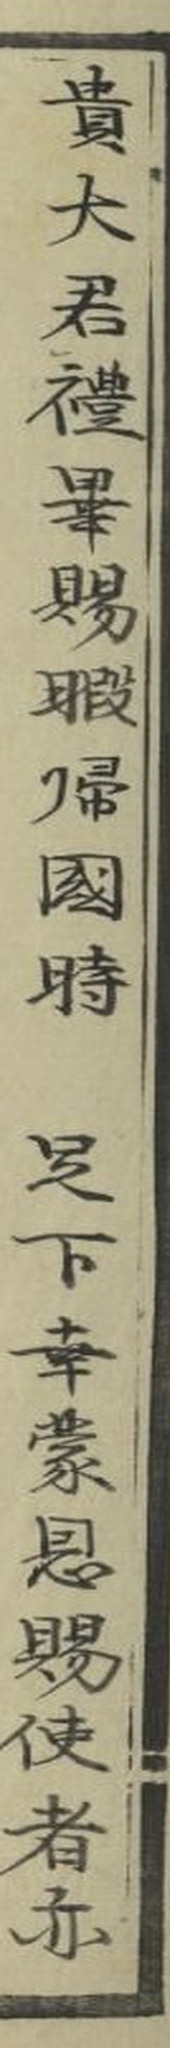貴大君礼畢賜暇帰国時足下幸蒙恩賜使者亦
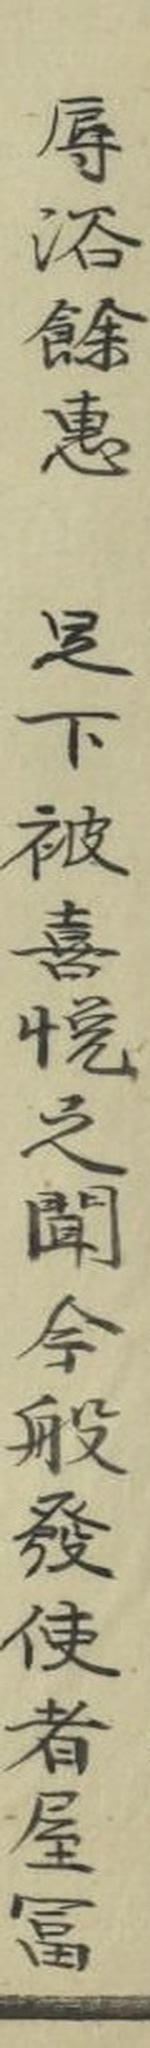辱浴余恵足下被喜悦之聞今般発使者屋富
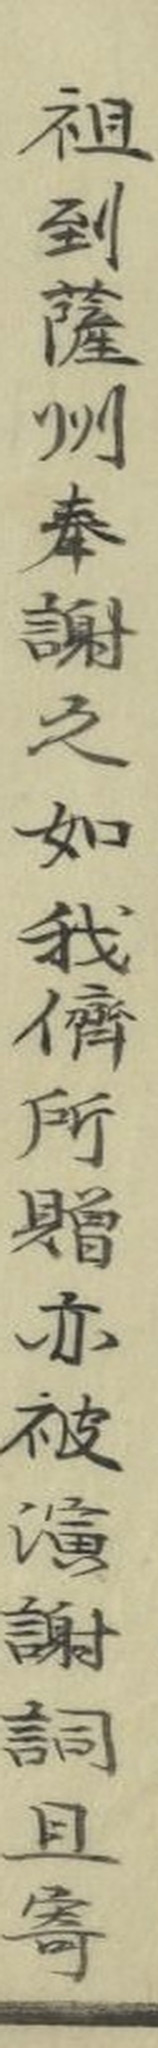祖到薩州奉謝之如我済所贈亦被演謝詞且寄
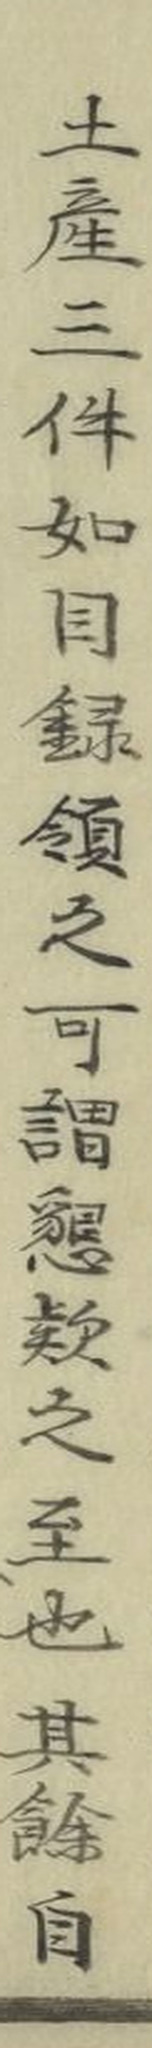土産三件如目録領之可謂懇款之至也其余自
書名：琉球往来（上）
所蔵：University of the Ryukyus Library
